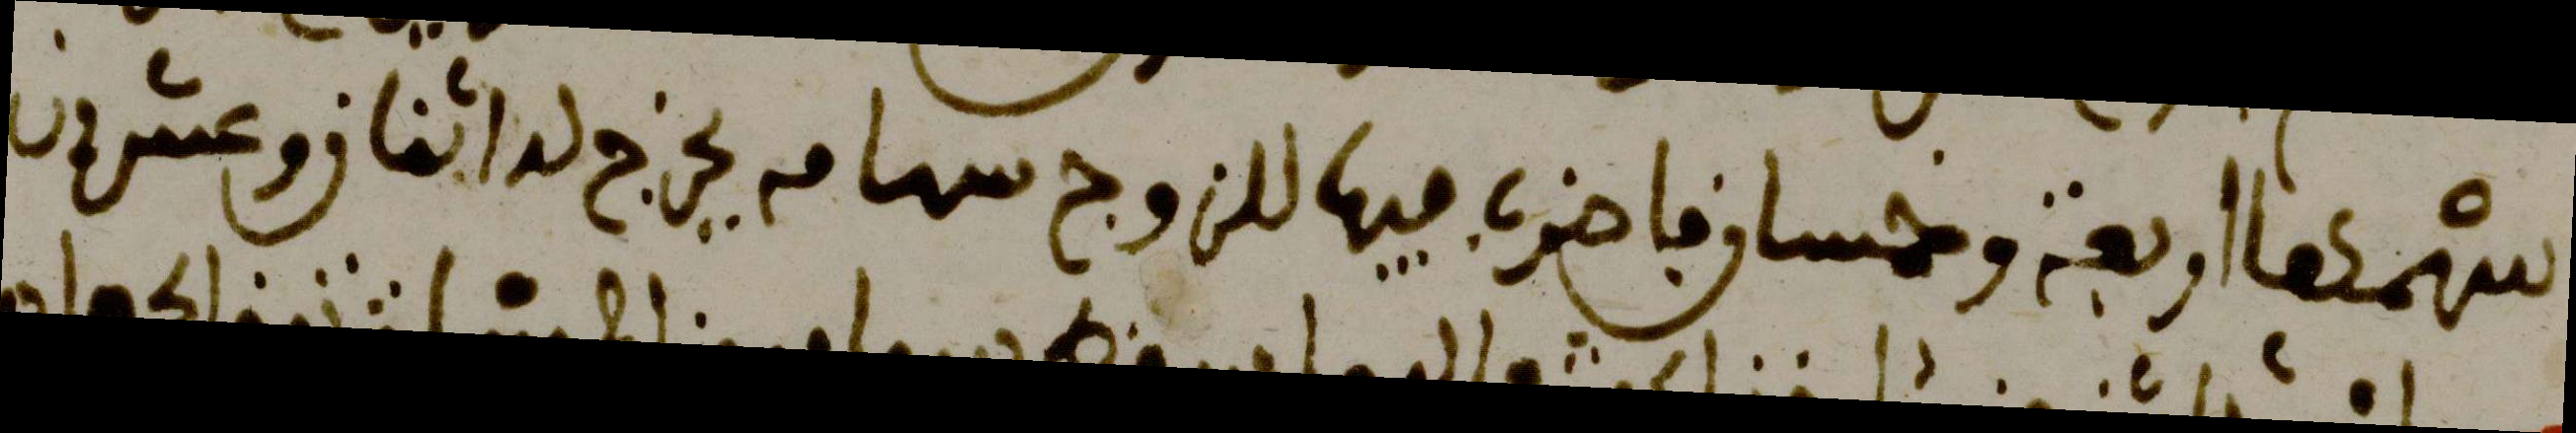سهْمها اربعة وخمسان فاضرب فيها للزوج سهامه يخرج له اثنان وعشرون
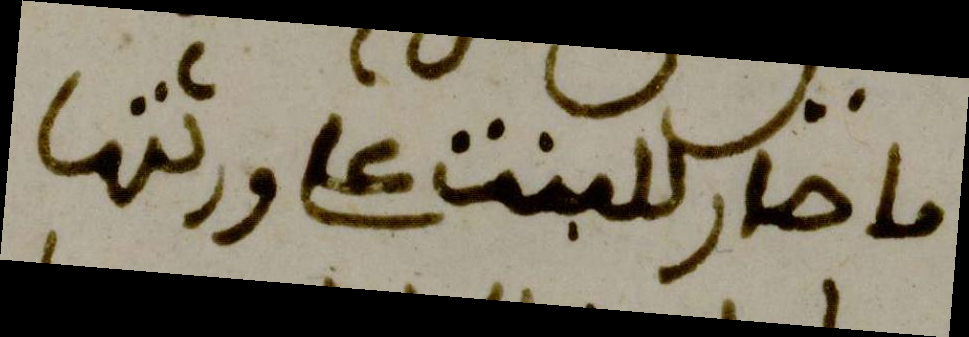ما صار للبنت على ورثتها
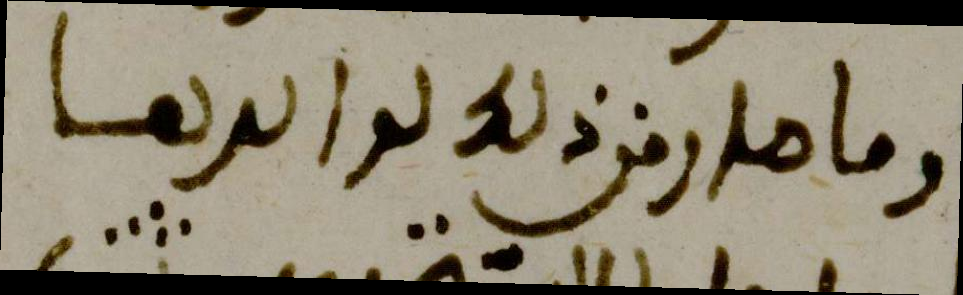وما صار من ذلك لوالدها
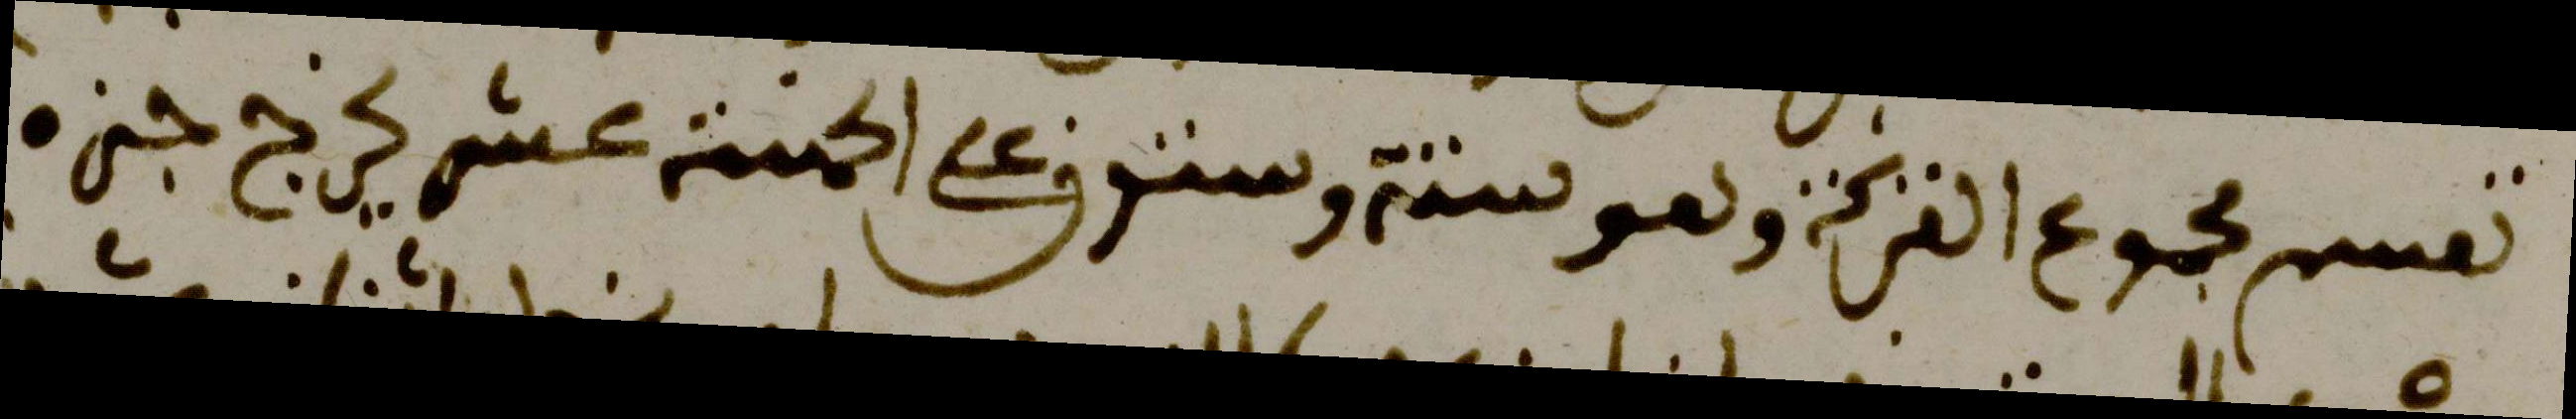تقسم مجموع التركة وهو ستة وستون على الخمسة عشر يخرج جزء
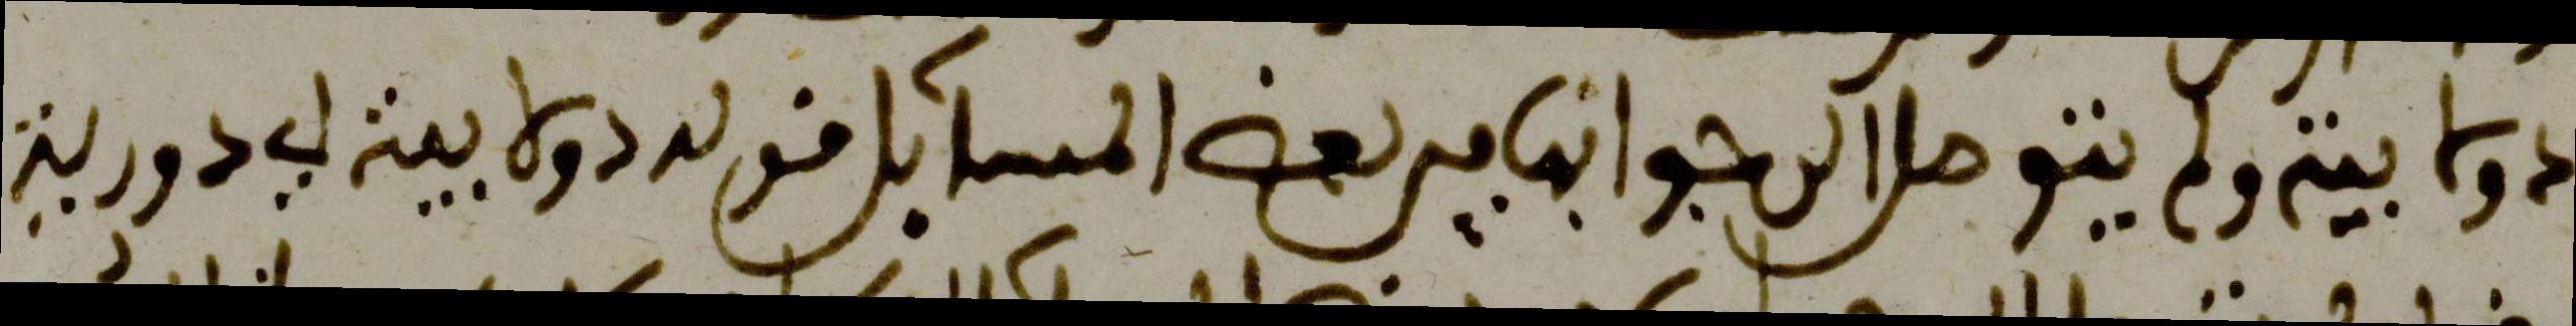دولا بية ولم يتوصل الى جوابها في بعض المسائل قوله ولم دولا بية اي دورية
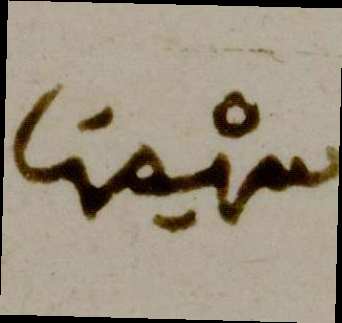سهْمها
